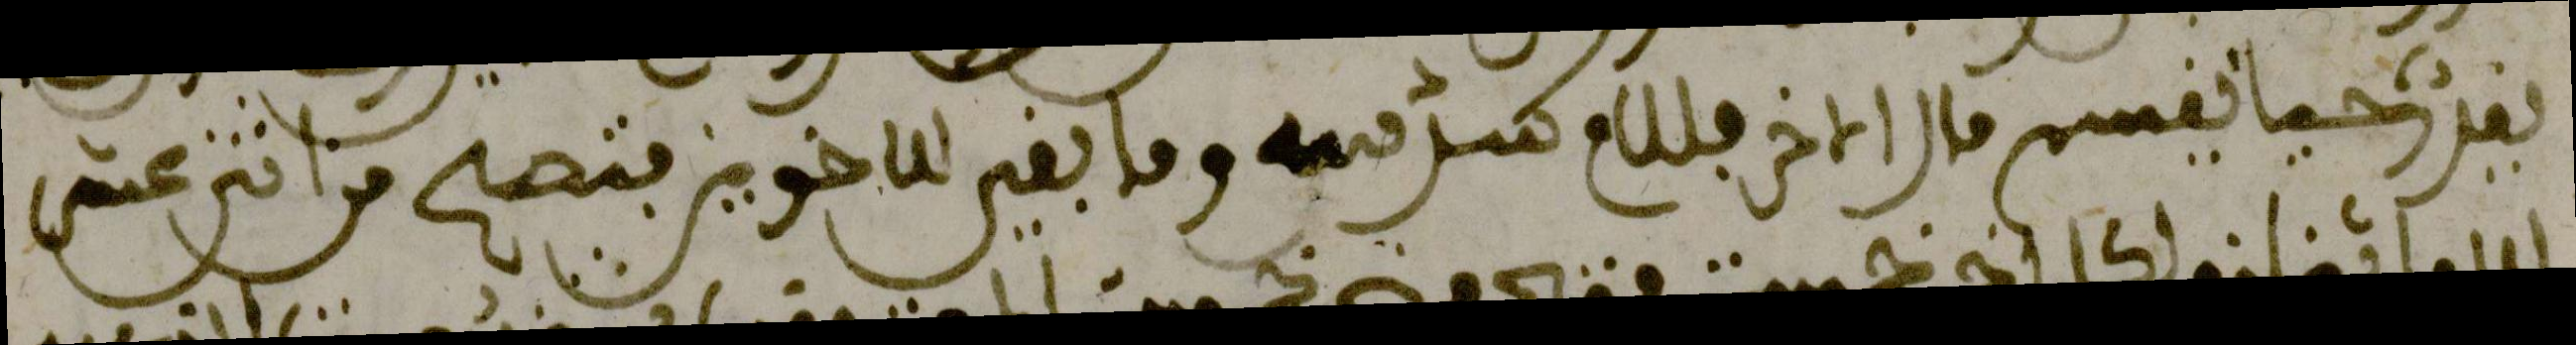يقدر حيا يقسم مال الاخر فللام سدسه وما بقي للاخوين فتصح من اثنى عشر
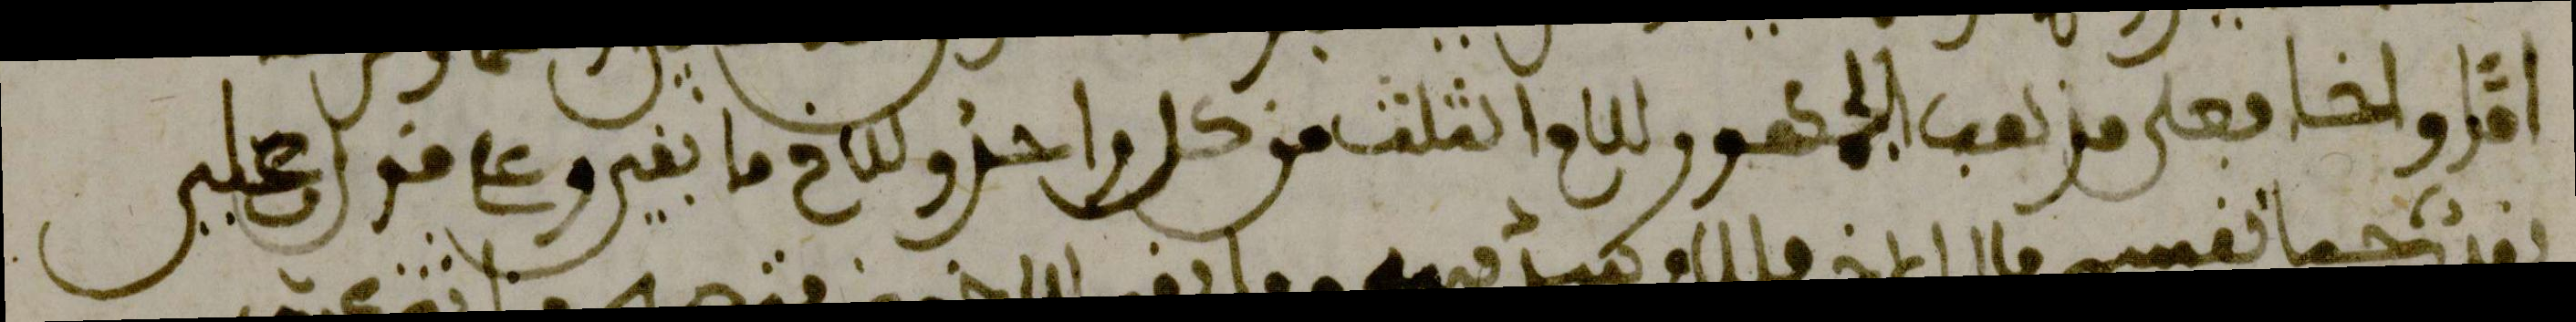اما واخا فعلى مذهب الجمهور للام الثلث من كل واحد وللاخ ما بقي وعلى قول علي
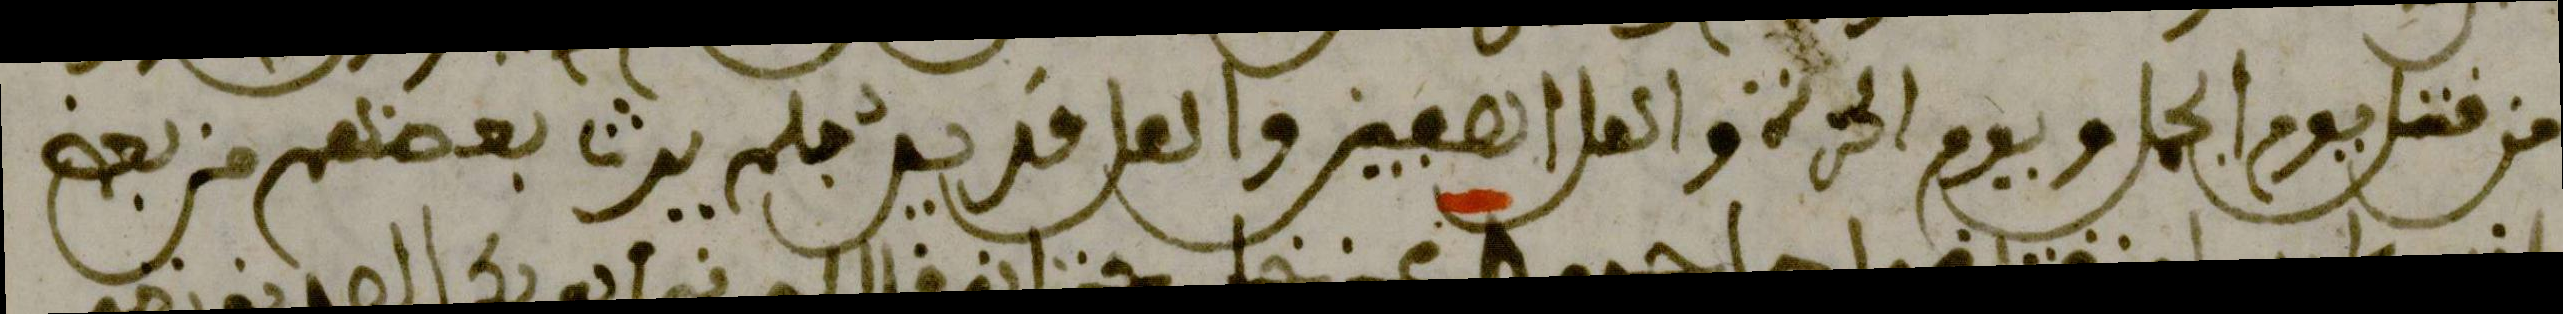من قتل يوم الجمل ويوم الحرة واهل الصفين واهل قديد فلم يرث بعضهم من بعض
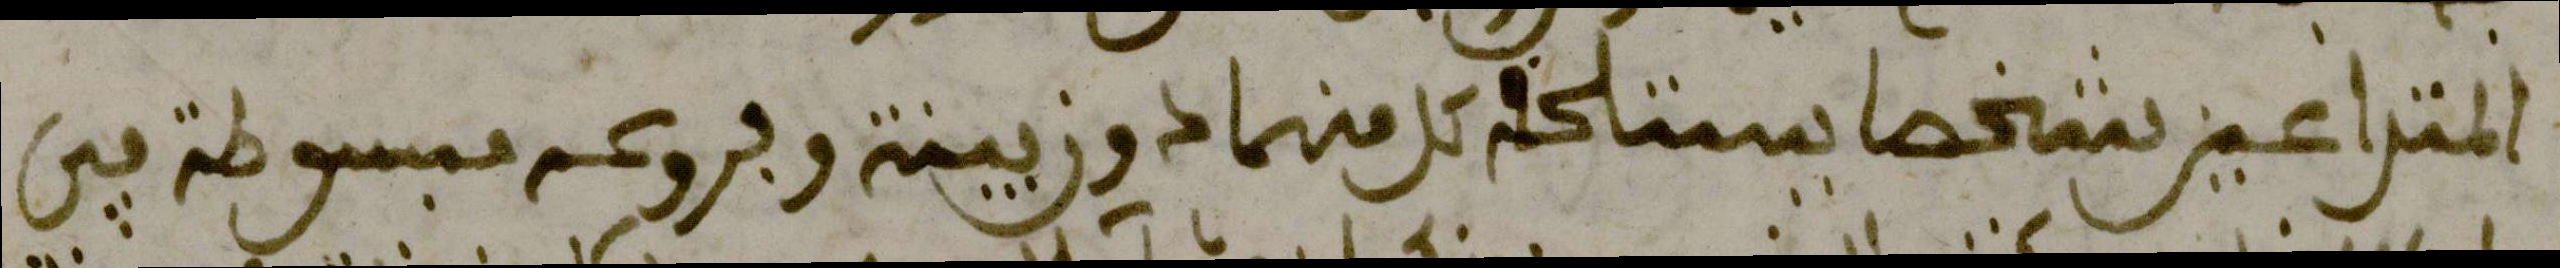المتداعين شخصا يستلحقه كل منها دون بينة وفروعه مبسوطة في
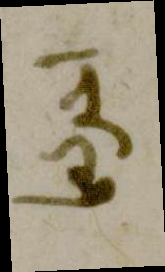احدهما
